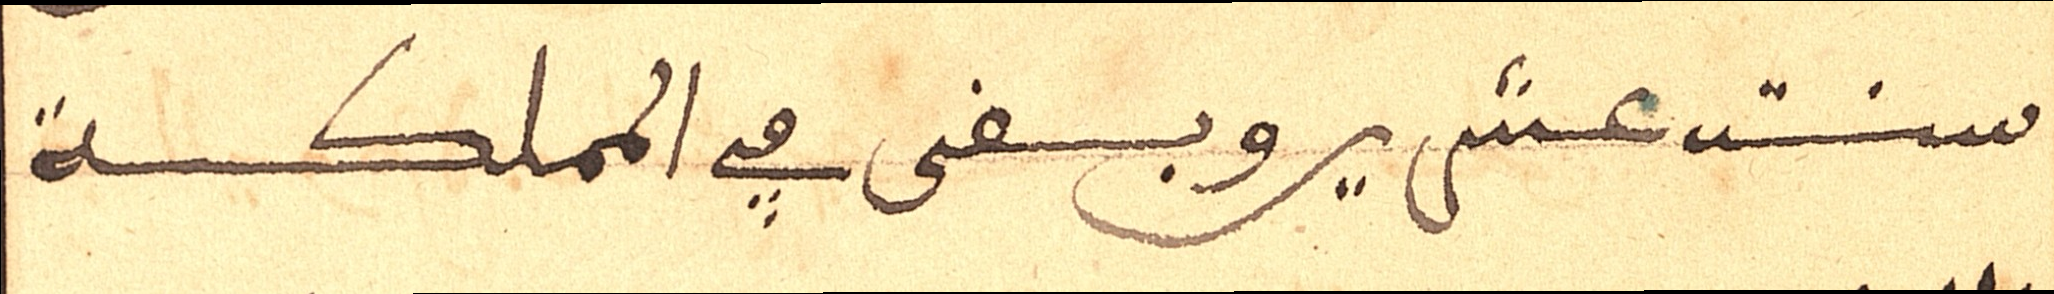سنت عشرين وبقى في المملكة
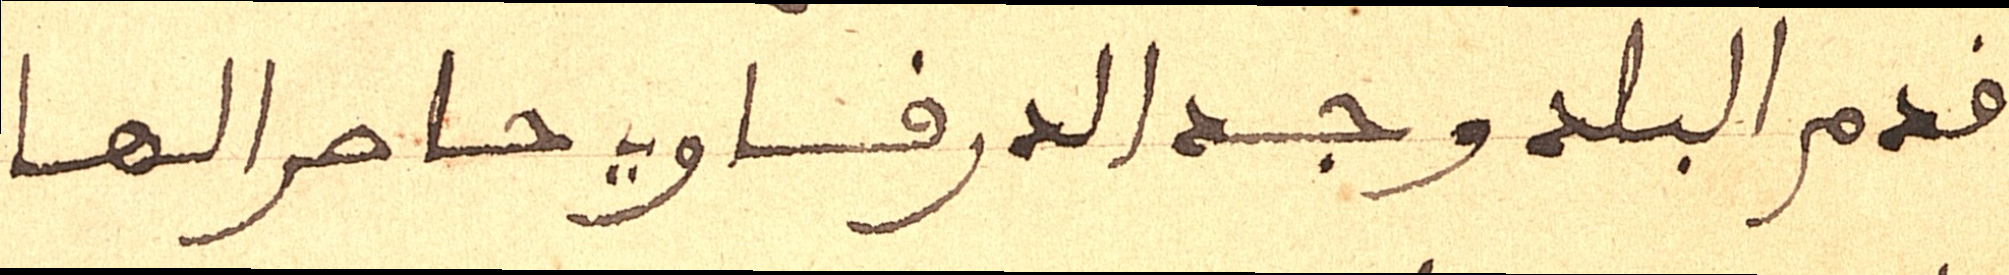قدم البلد وجد الدرقاوي حاصرا لها
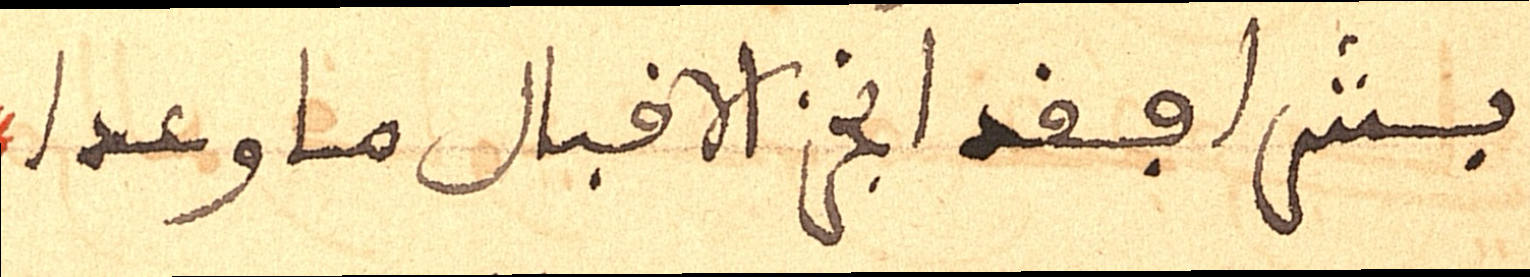بشر افقد انجز الاقبال ما وعدا
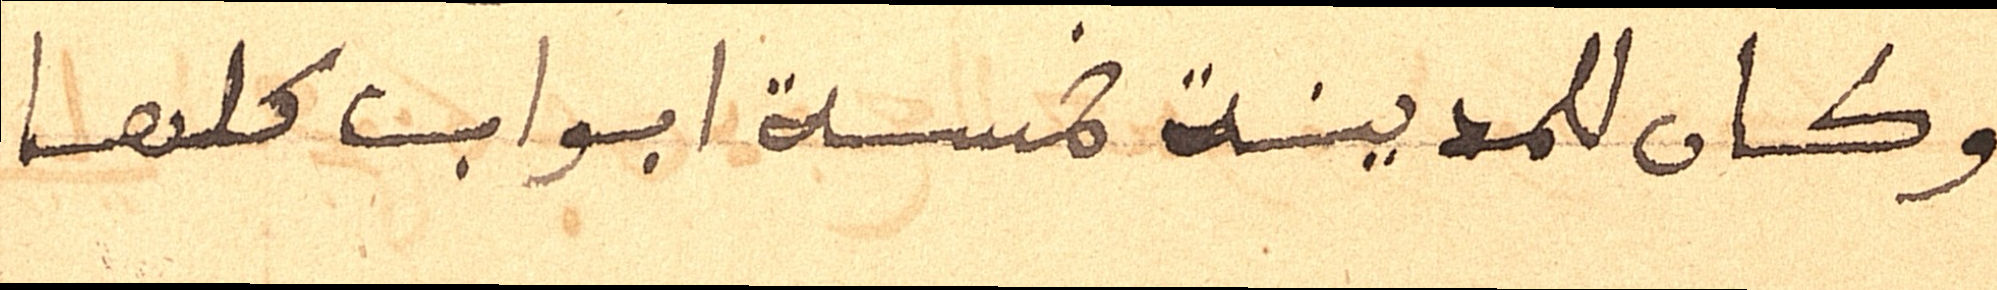وكان للمدينة خمسة ابواب كلها
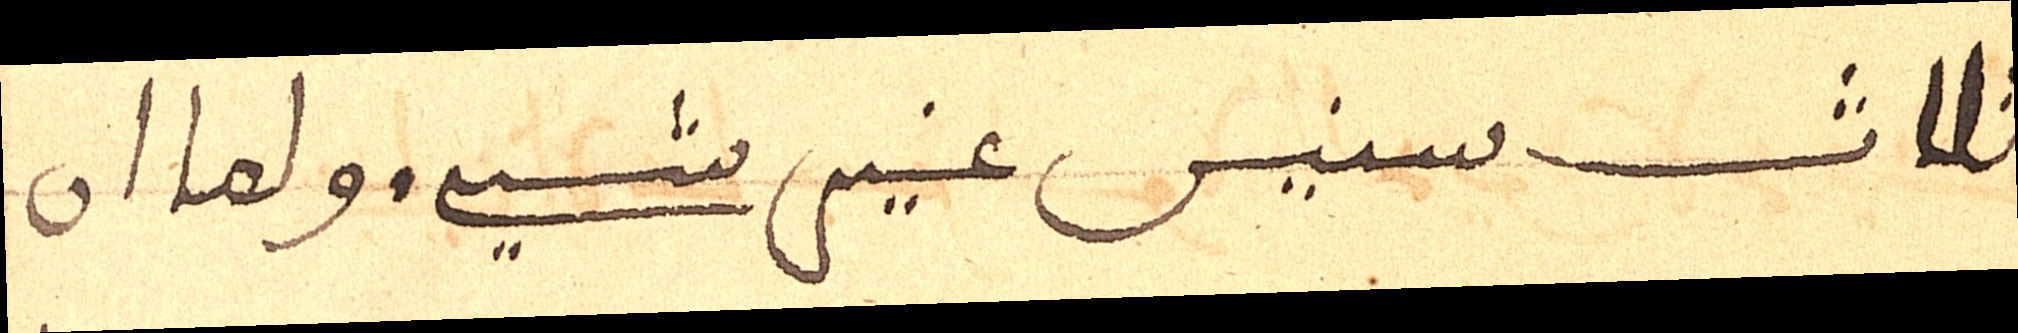ثلاث سنين غير شيء ولما ان
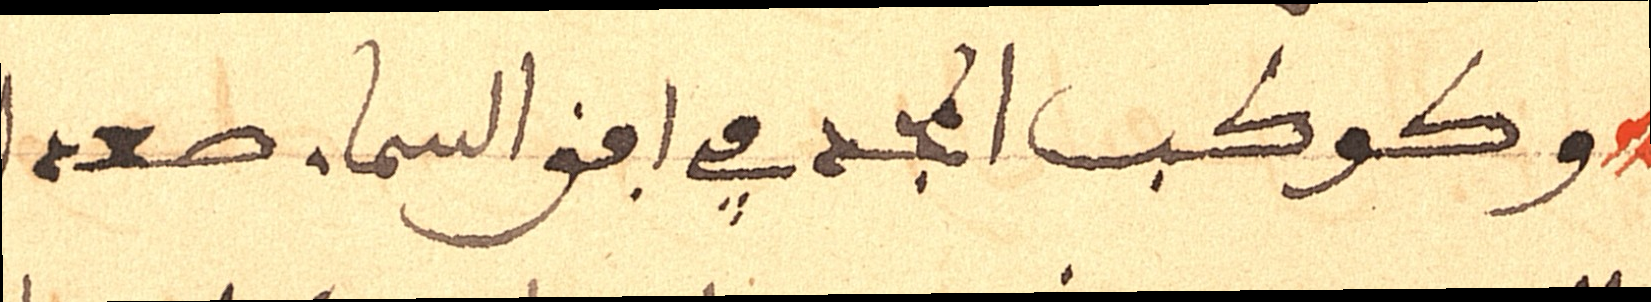وكوكب المجد في افق السماء صعدا
